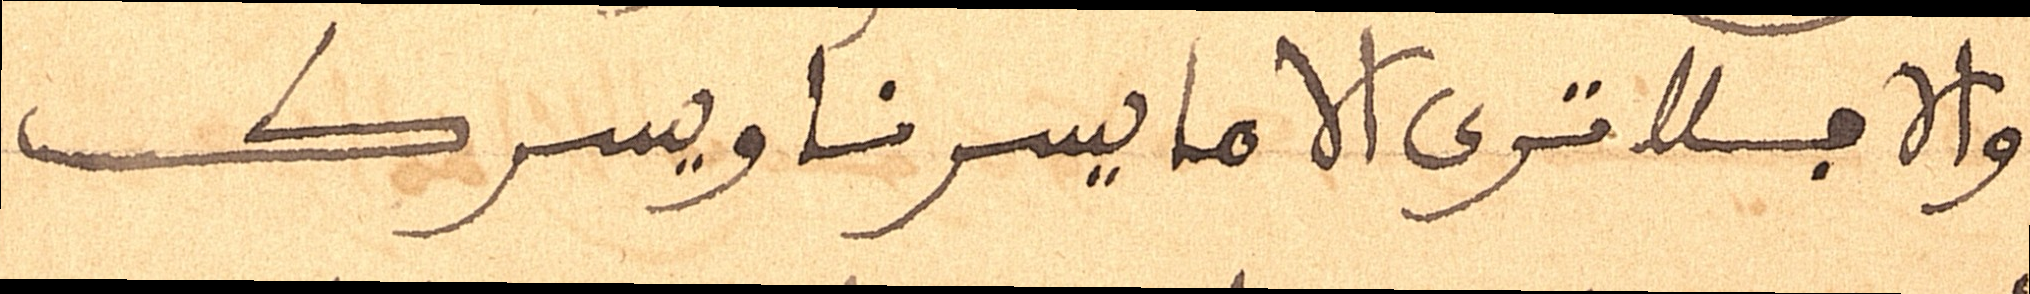والا فلا ترى الاما يسرنا ويسرك
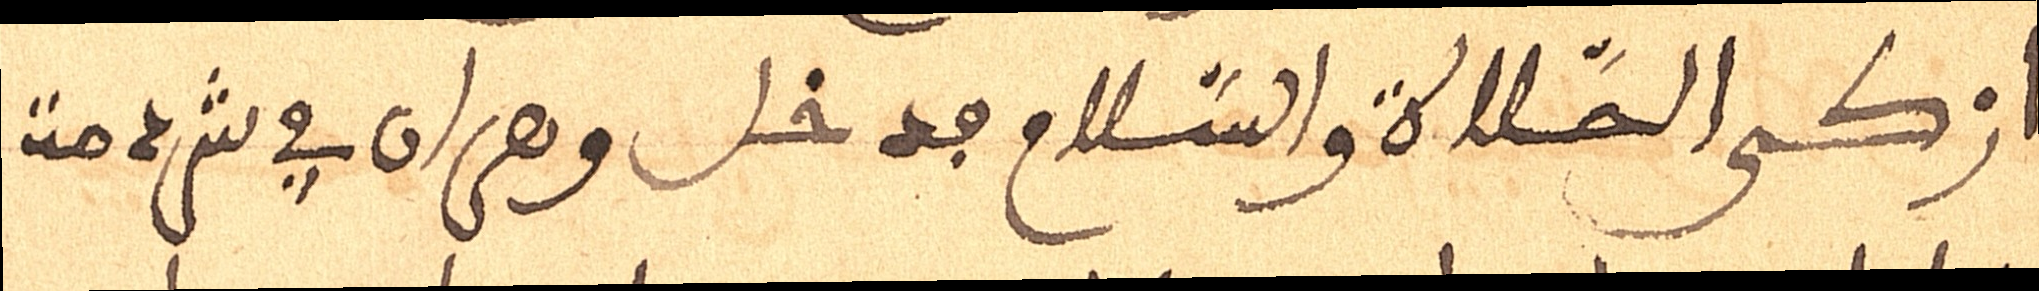ازكى الصلاة والسلام فدخل وهران في شردمة
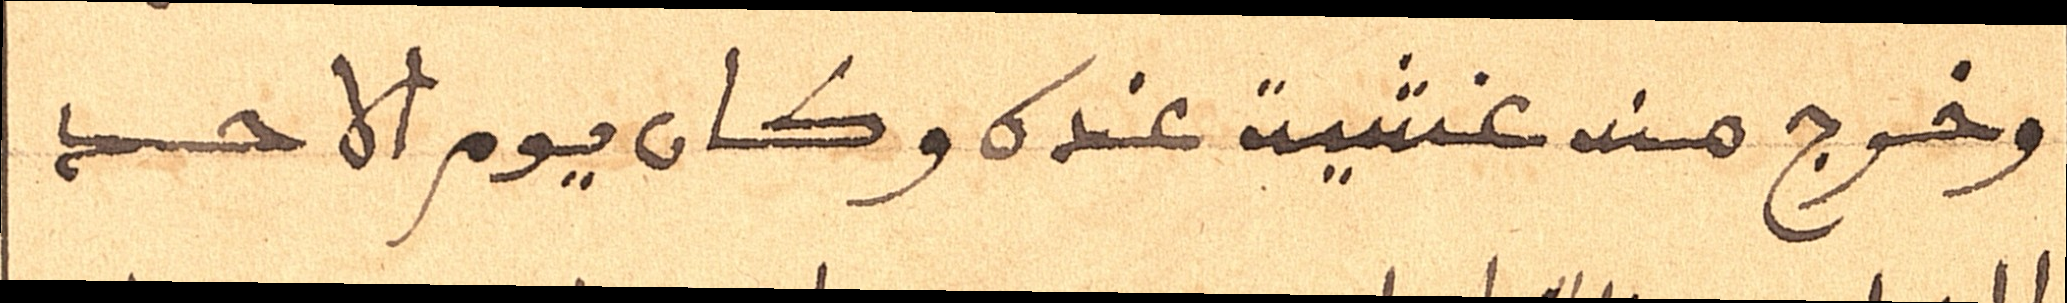وخرج منه غشية غده وكان يوم الاحد
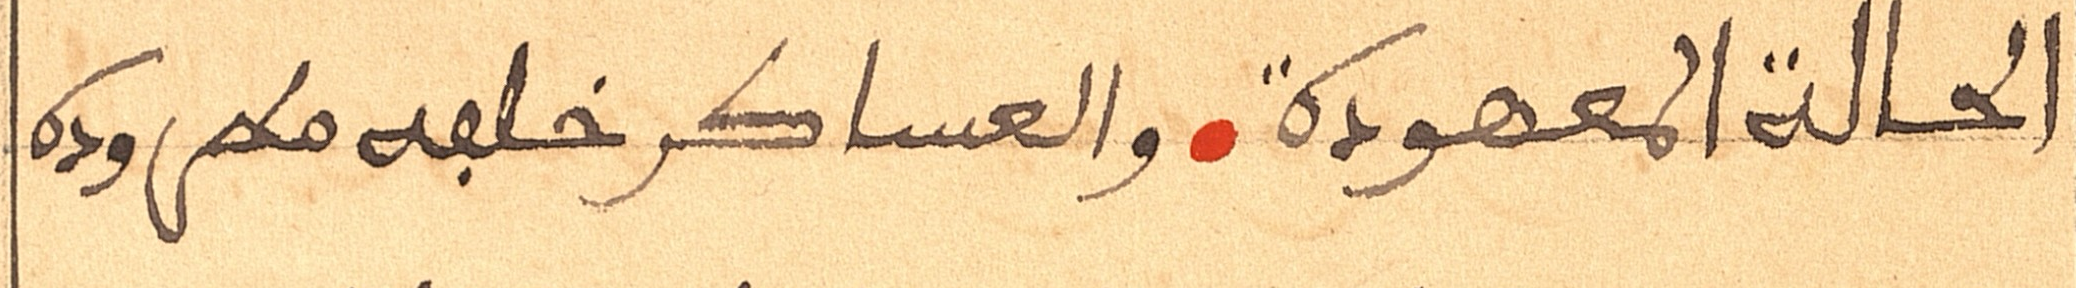الحالة المعهودة والعساكر خلفه مطروده
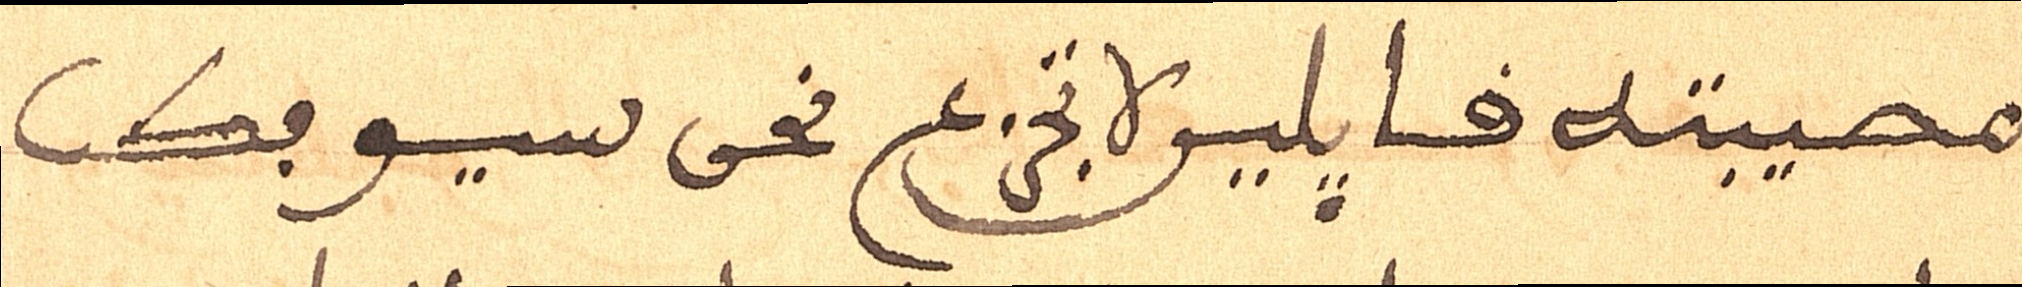مصيبته قائلين لا تجزع نحن سيوفك
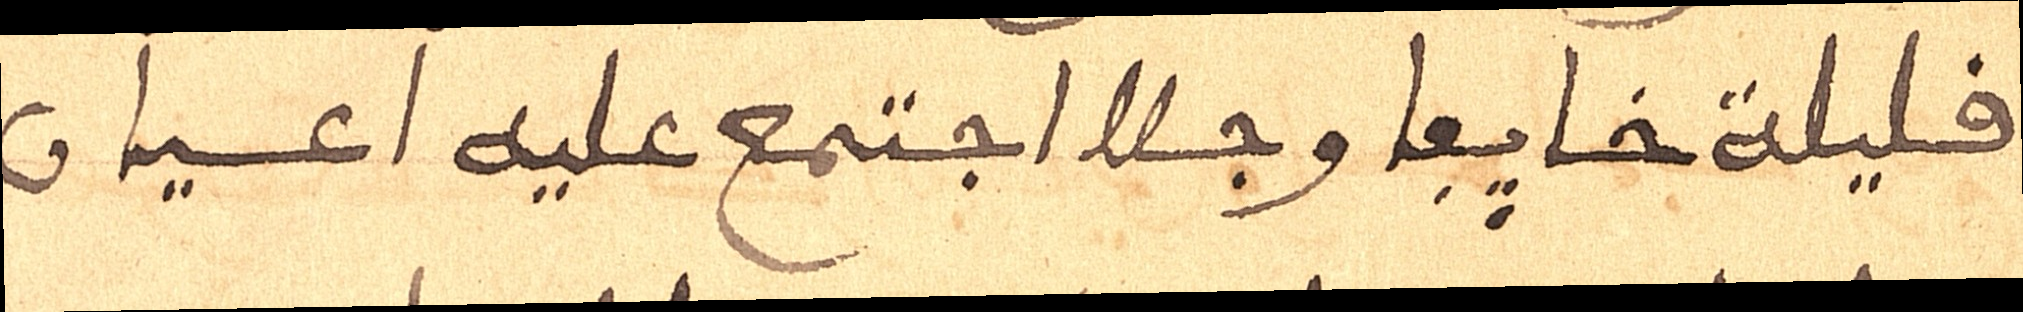قليلة خائفا وجلا اجتمع عليه اعيان
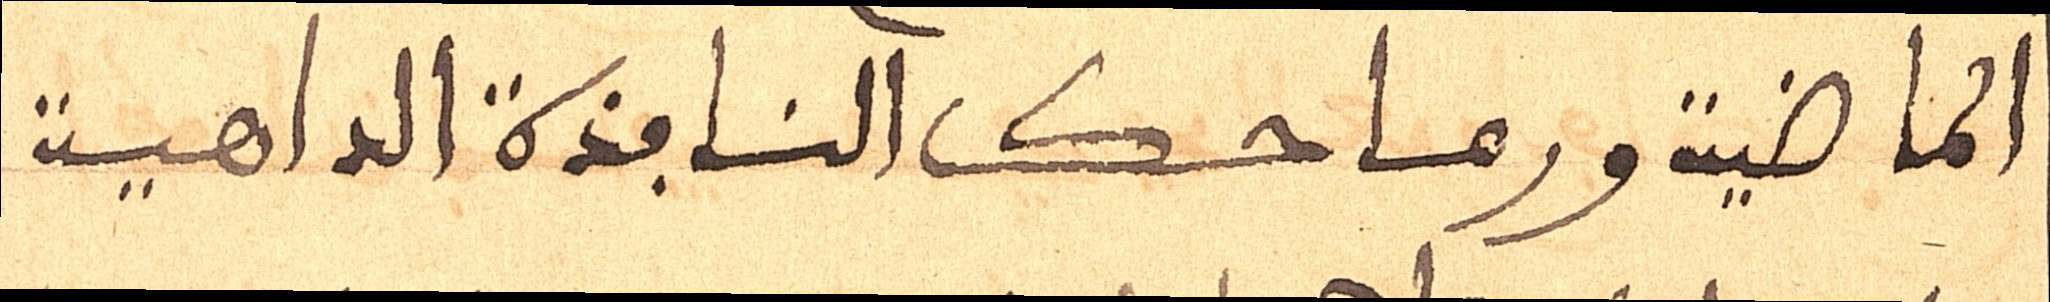الماضية ورماحك النافذة الداهية
